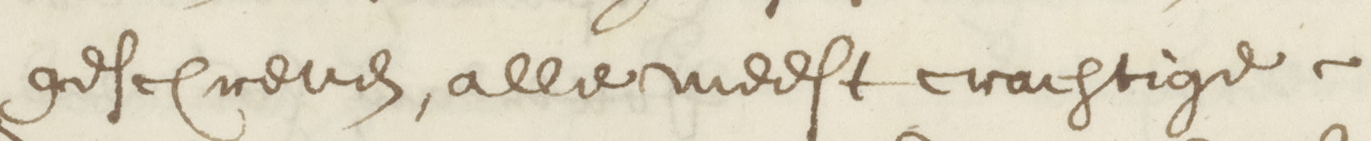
geschreven, alle meest crachtige
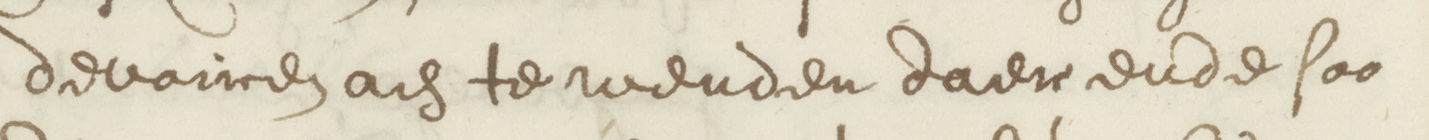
devoiren aen te wenden daer ende soo
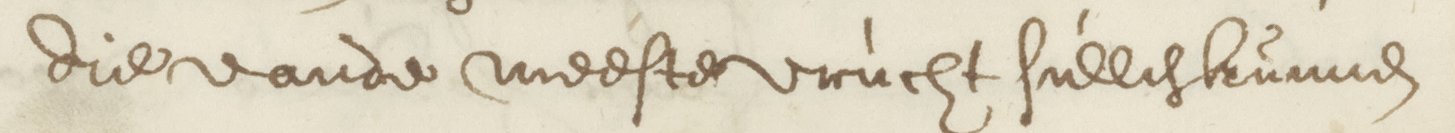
die vande meeste vrucht sulle kunnen
